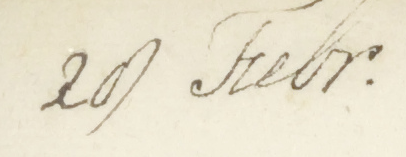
28 Febr.
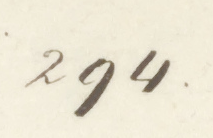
294.
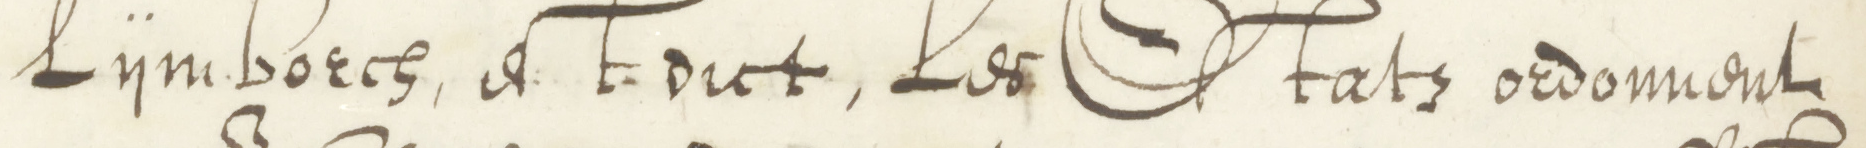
Lijmborch, est dict, les Estatz ordonnent
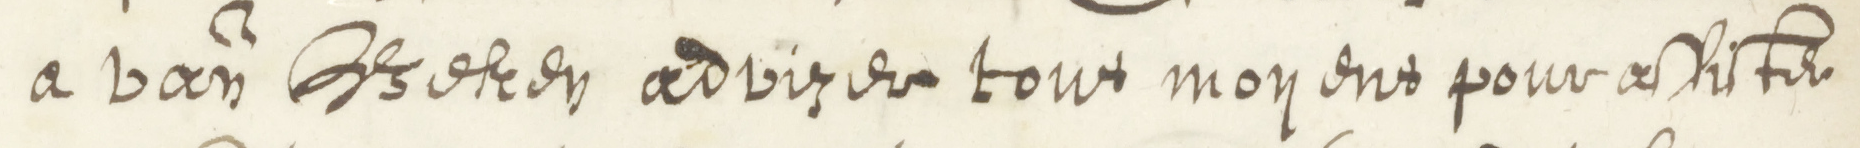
a van Beken advizer tous moyens pour assister
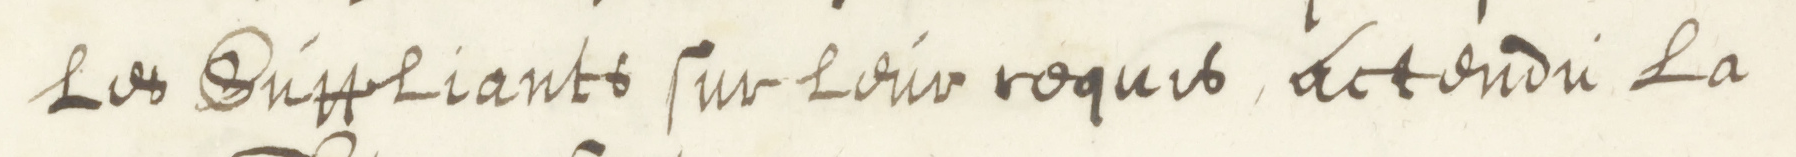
les Suppliants sur leur requis, actendu la
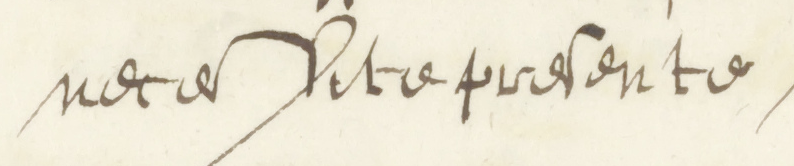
necessite presente
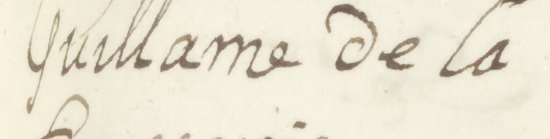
Guillame de la
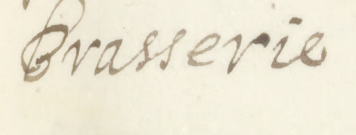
Brasserie
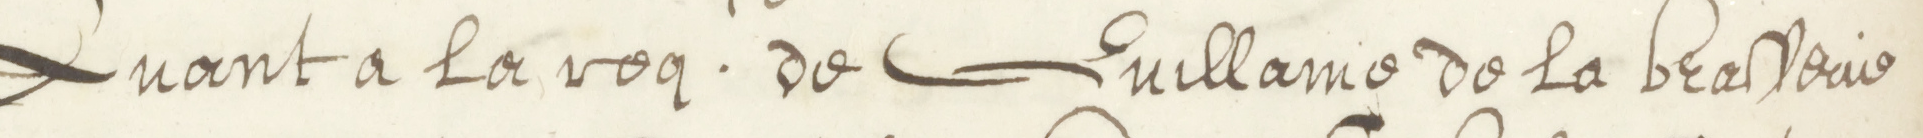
Quant a la reqte. de Guillame de la brasserie
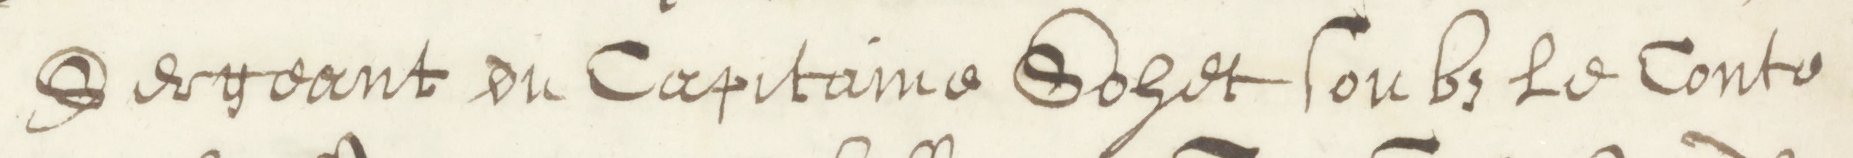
Sergeant du Capitaine Schet soubz le Conte
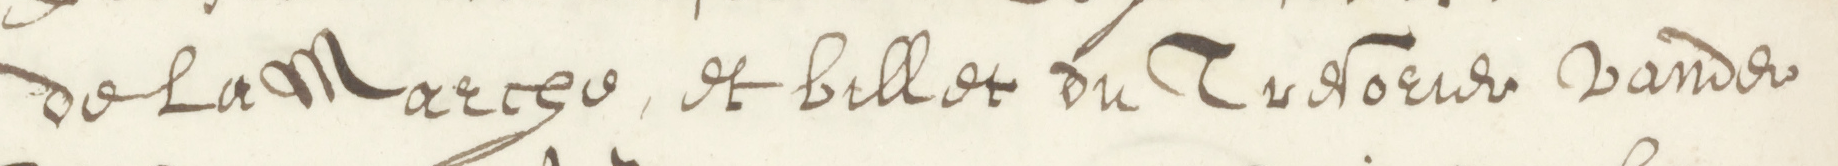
de la Marche, et billet du Tresorier vander
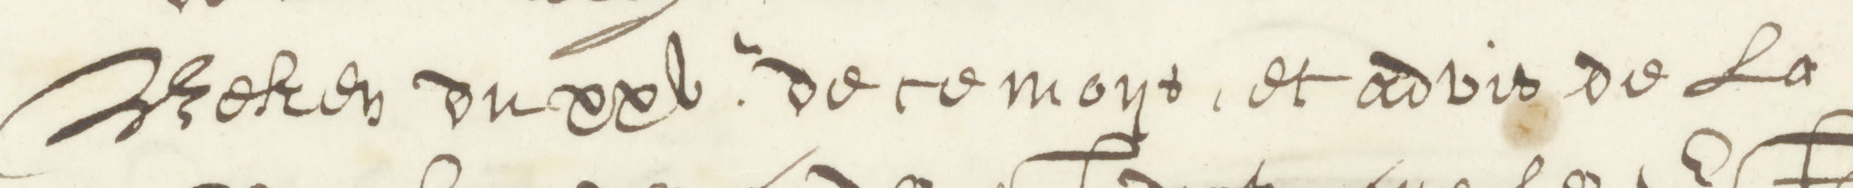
Beken du xxve de ce moys, et advis de la
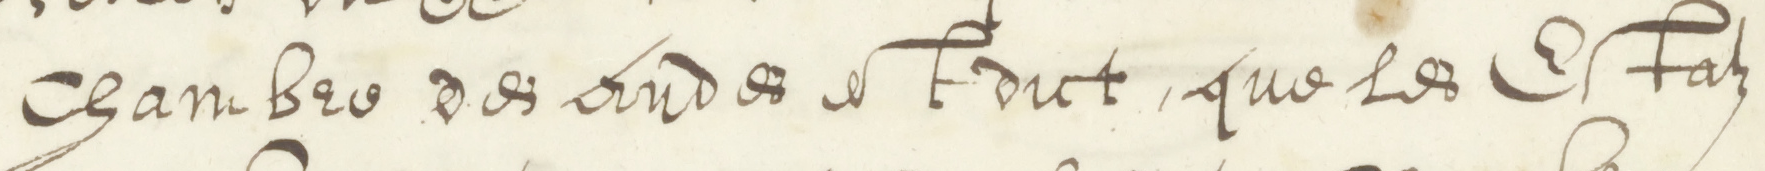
Chambre des aydes est dict, que les Estatz
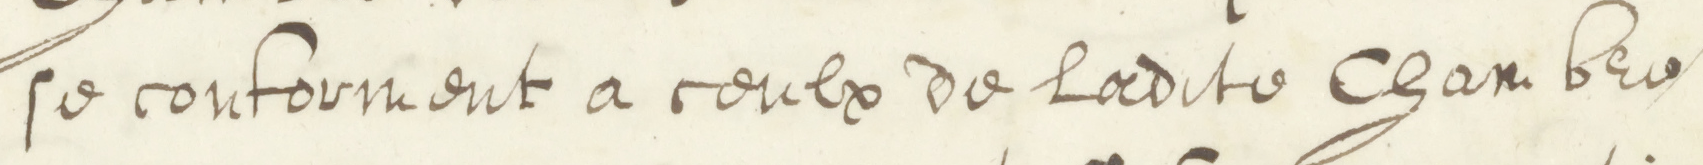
se conforment a ceulx de ladite Chambre
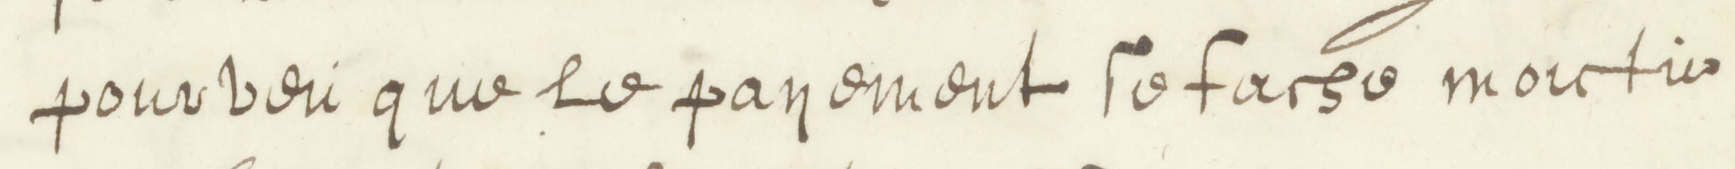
pour veu que le payement se fache moictie
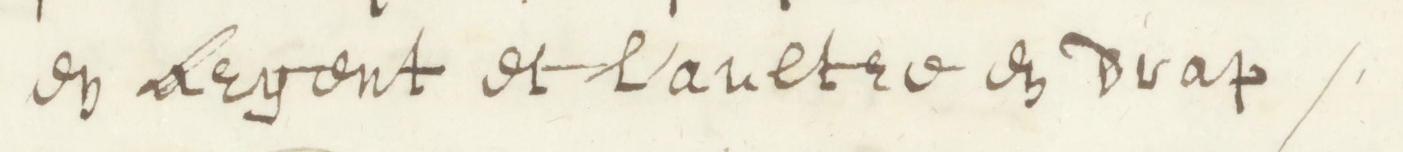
en argent et l‛aultre en drap.
